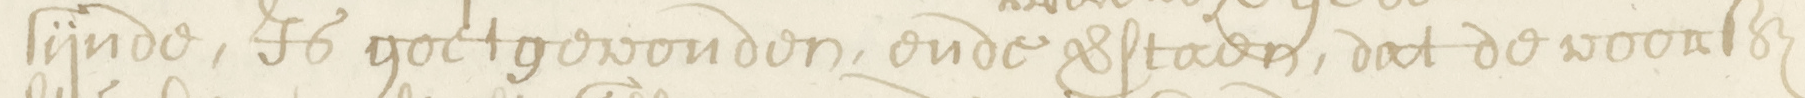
sijnde, is goetgevonden, ende vstaen, dat de voors
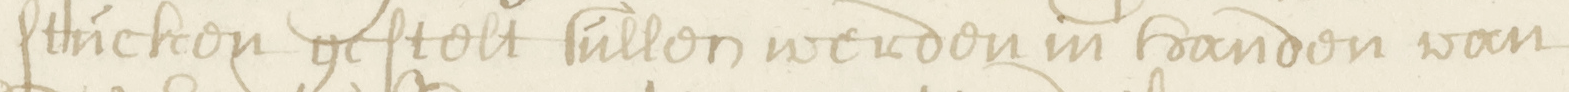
stucken gestelt sullen werden in handen van
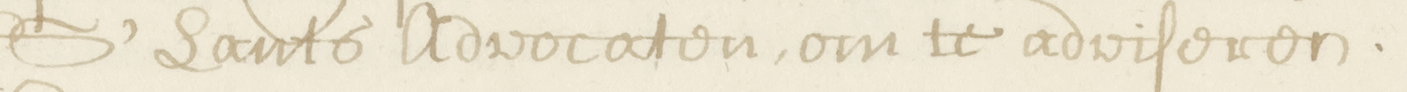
S'Lants Advocaten, om te adviseren.
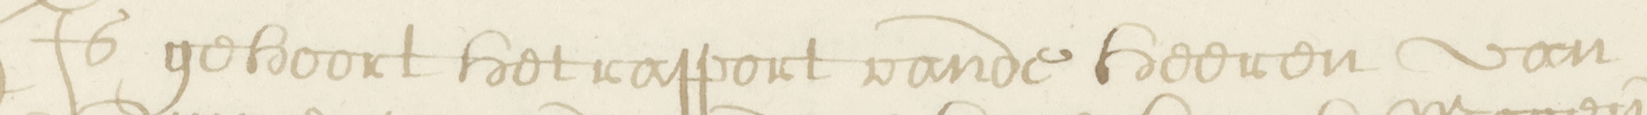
Is gehoort het rapport vande heeren van
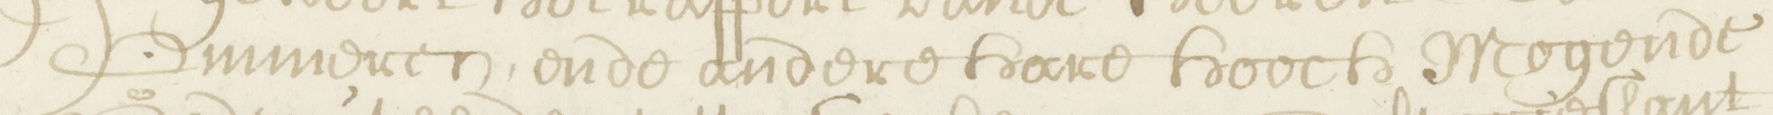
Ommeren, ende andere hare hooch Mogende
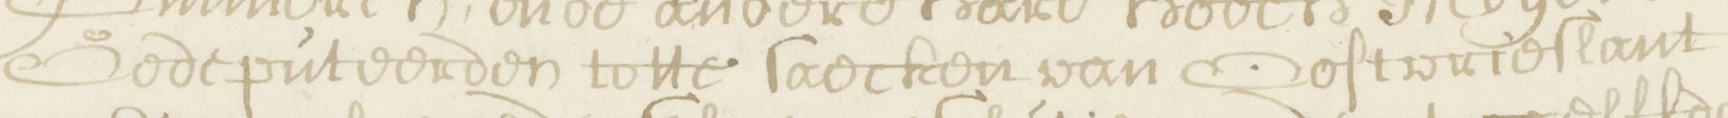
Gedeputeerden totte saecken van Oostvrieslant
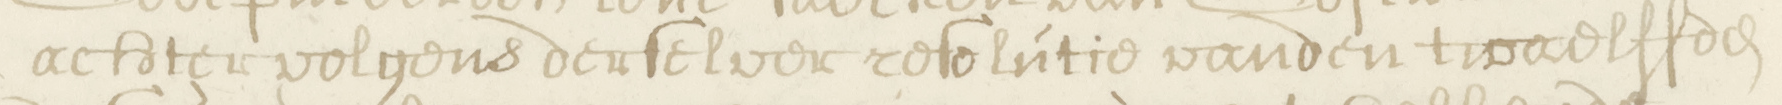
achtervolgens derselver resolutie vanden twaelffden
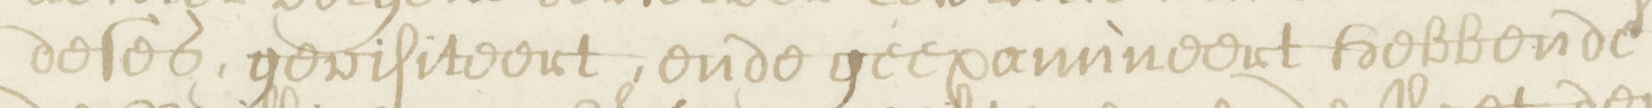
deses, gevisiteert, ende geexamineert hebbende
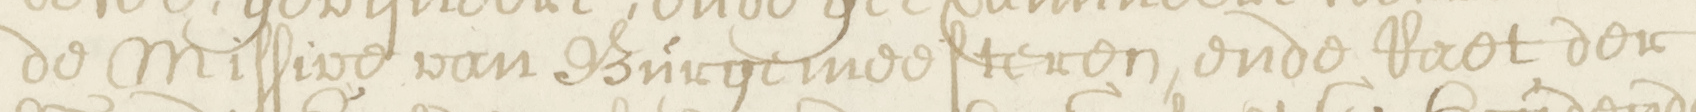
de missive van Burgemeesteren, ende Raet der
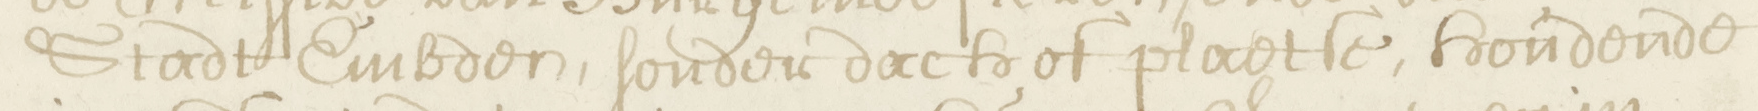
Stadt Embden, sonder dach of plaetse, houdende
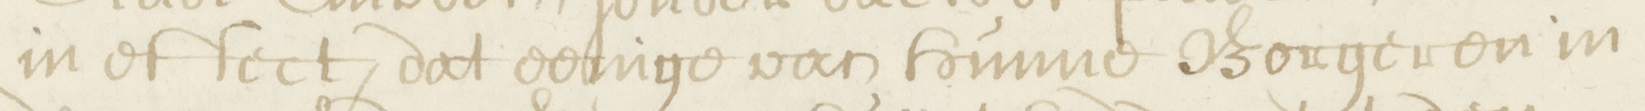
in effect, dat eenige van hunne Borgeren in
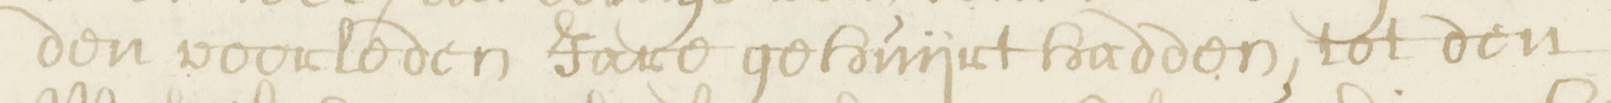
den voorleden jare gehuijrt hadden tot den
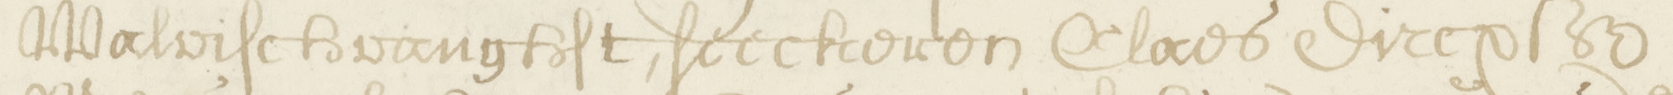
Walvischvanghst, seeckeren Claes Dircxsz
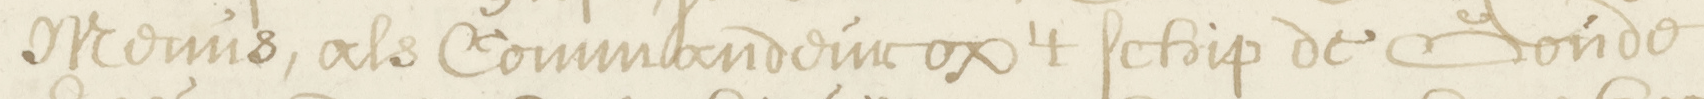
Menus, als Commandeur op 't schip de Goude
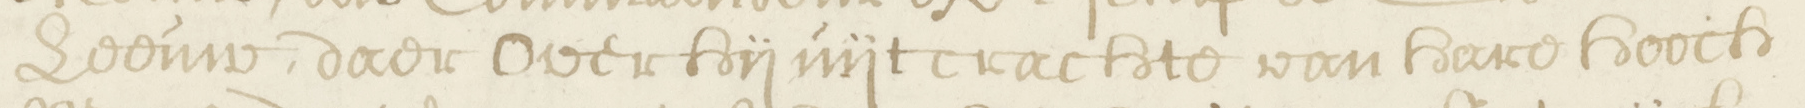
Leeuw, daer over hij uijt crachte van hare hooch
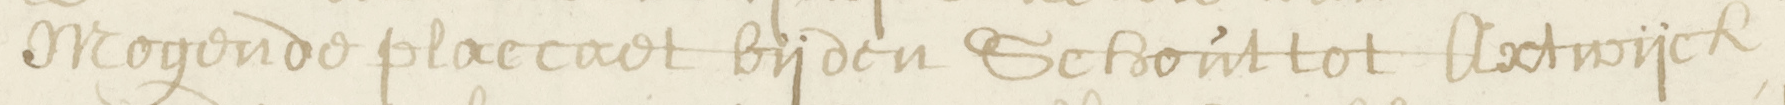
Mogende placcaet bijden Schout tot Axtwijck
